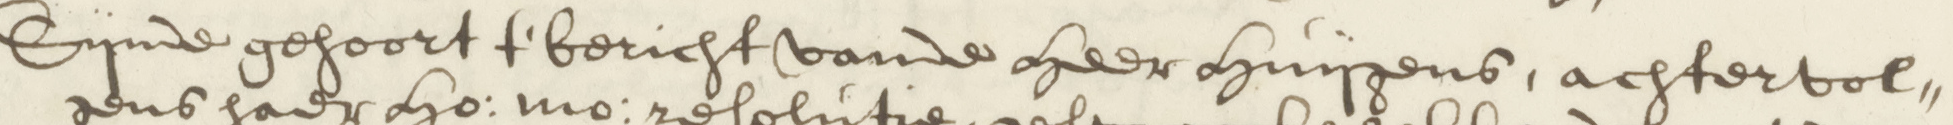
Sijnde gehoort t'bericht vande Heer Huijgens, achtervol„
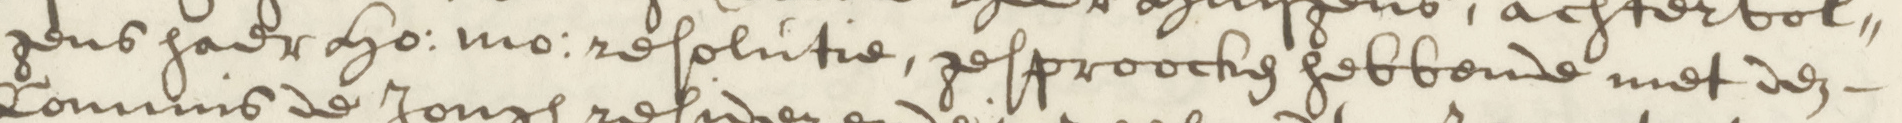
gens haer Ho:Mo: resolutie, gesproocken hebbende met den —
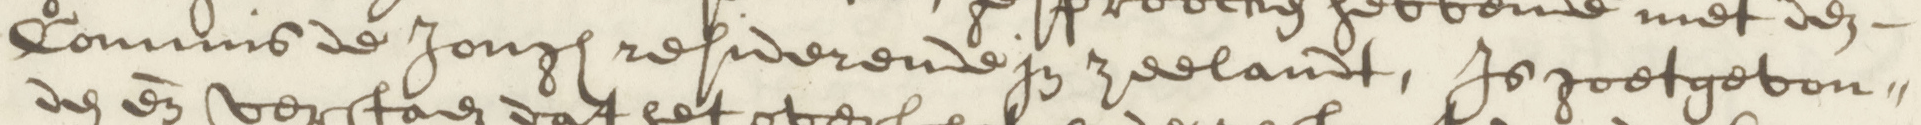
Commis de Jongh residerende in zeelandt, Is goetgevon„
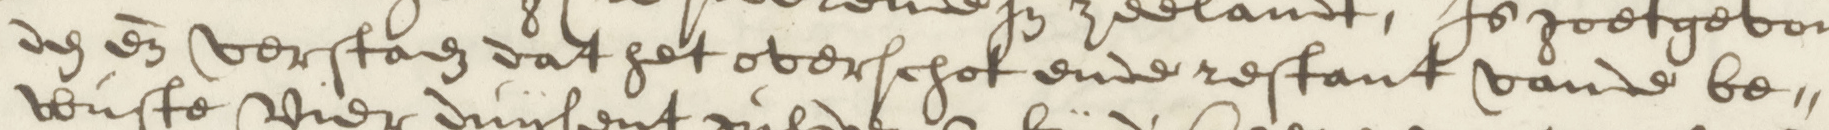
den en verstaen dat het overschot ende restant vande be„
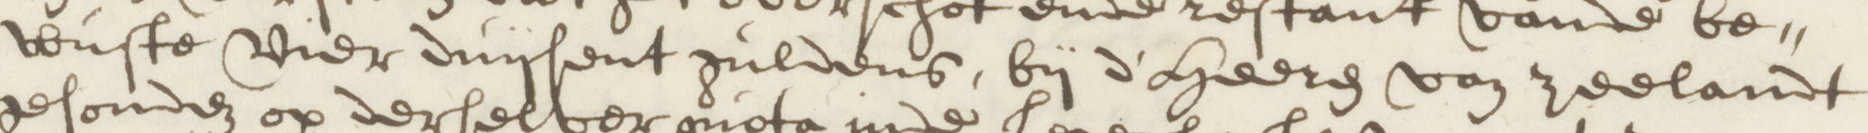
wuste Vier duijsent guldens, bij d'Heeren van zeelandt
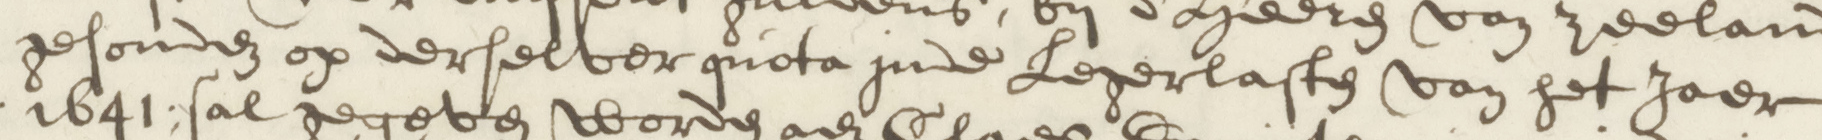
gesonden op derselver quota inde Legerlasten van het Jaer
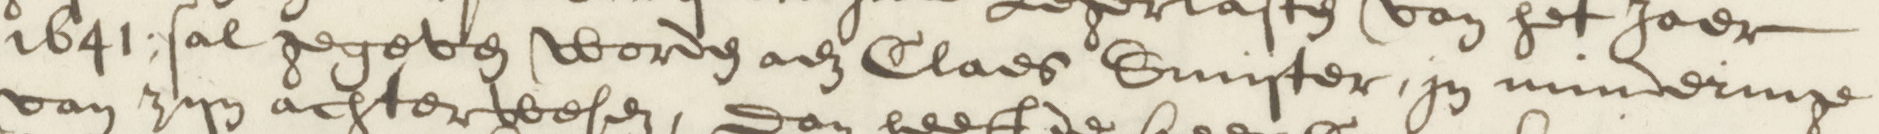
1641, sal gegeven worden aen Claes Smijter, in minderinge
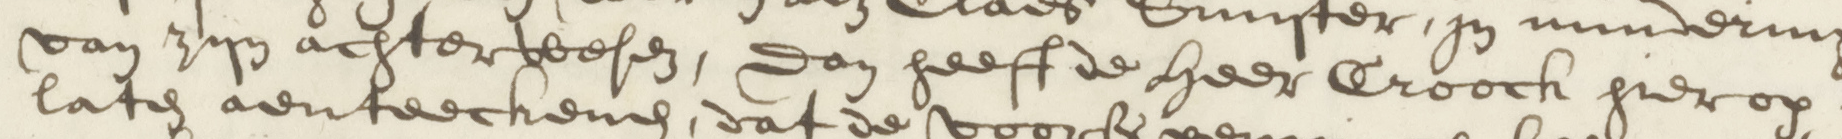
van zijn achterwesen. Dan heeft de Heer Croock hierop
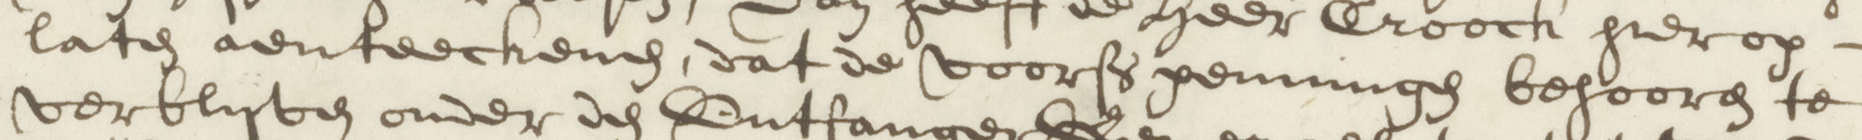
laten aenteeckenen, dat de voors penningen behooren te
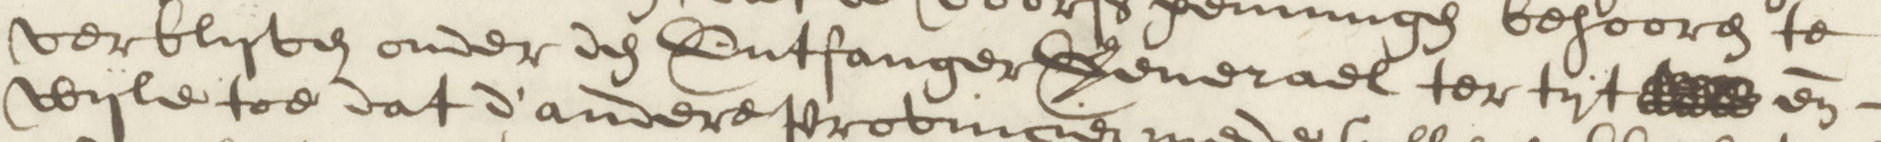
verblijven onder den Ontfanger Generael ter tijt xxx en
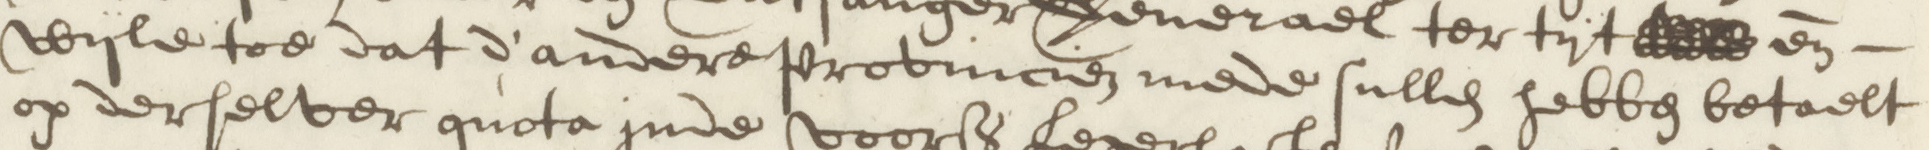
wijle toe dat d'andere Provincien mede sullen hebben betaelt
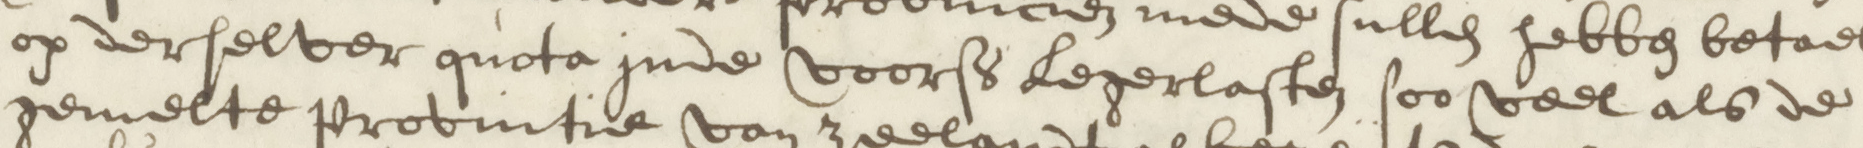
op derselver quota inde voors Legerlasten soo veel als de
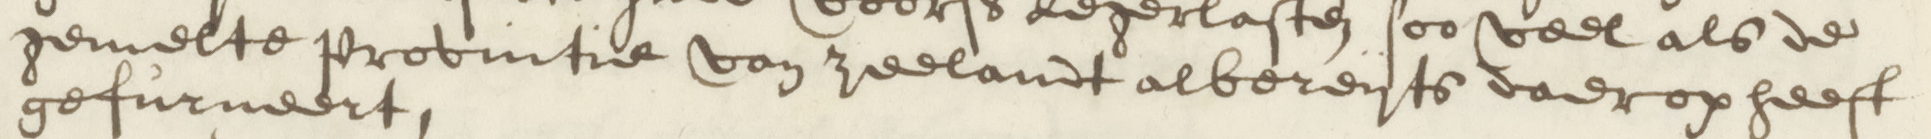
gemelte Provintie van zeelandt albereijts daerop heeft
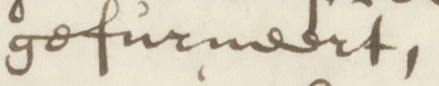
gefurneert.
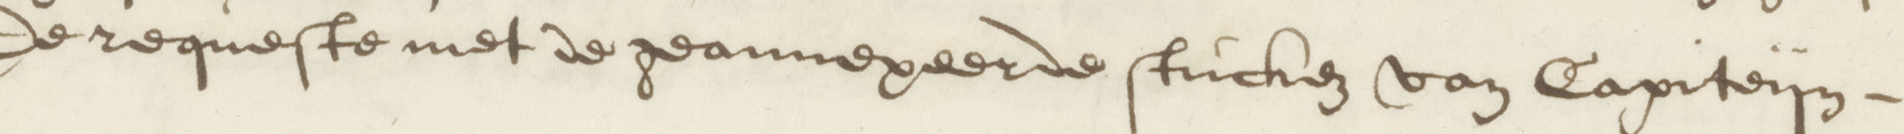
De requeste met de geannexeerde stucken van Capiteijn -
